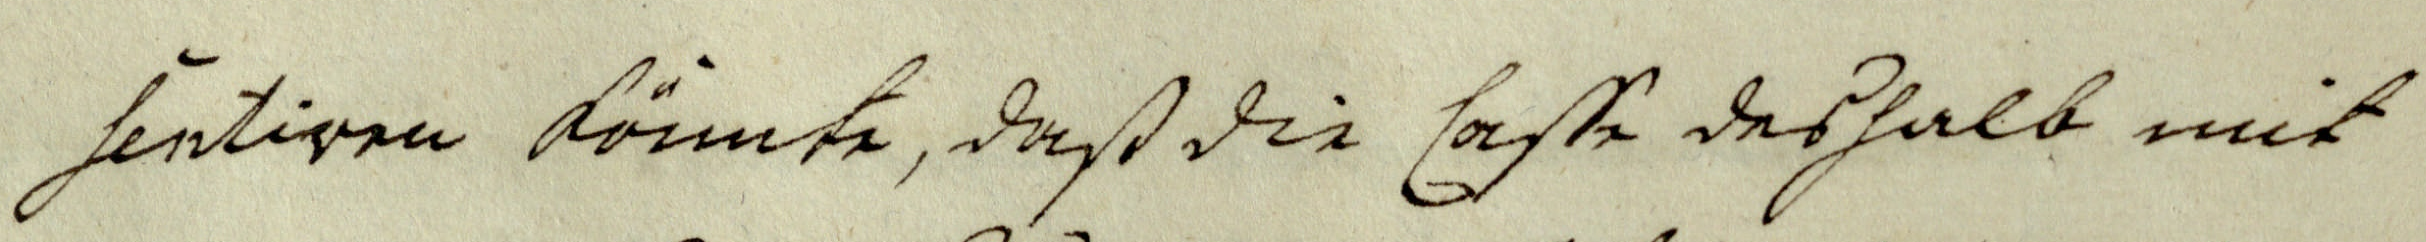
sentiren könnte, daß die Casse deshalb mit
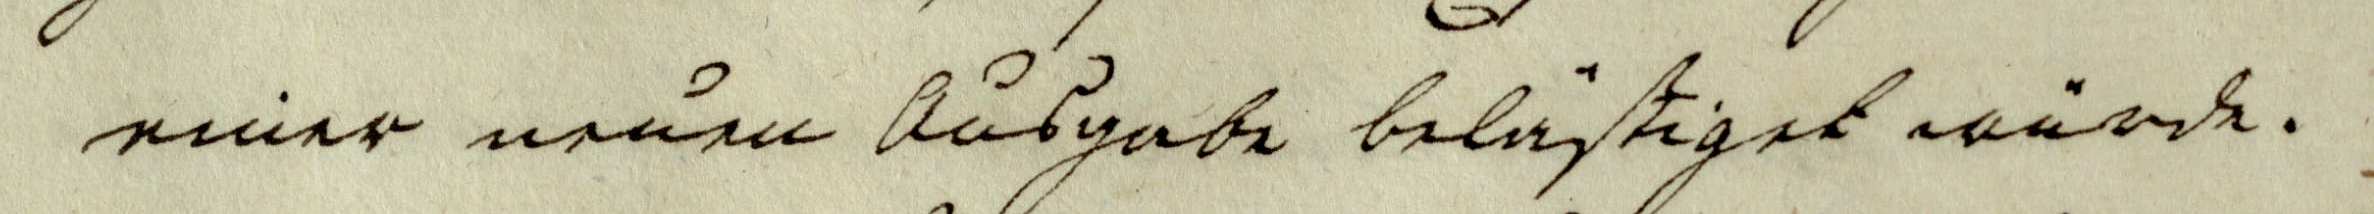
einer neuen Ausgabe belästiget würde.
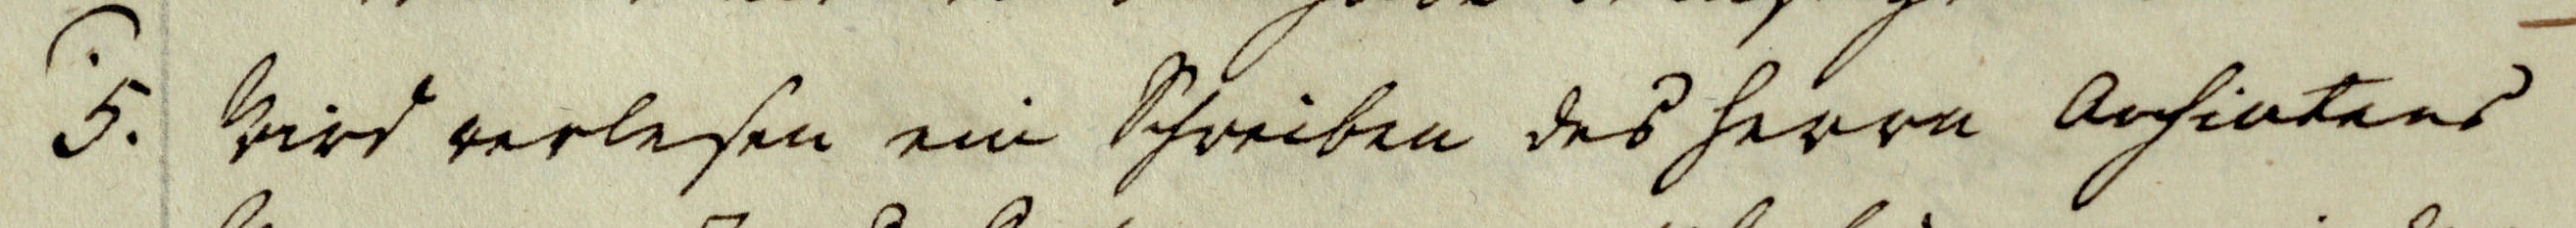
5. Wird verlesen ein Schreiben des Herrn Archiaters
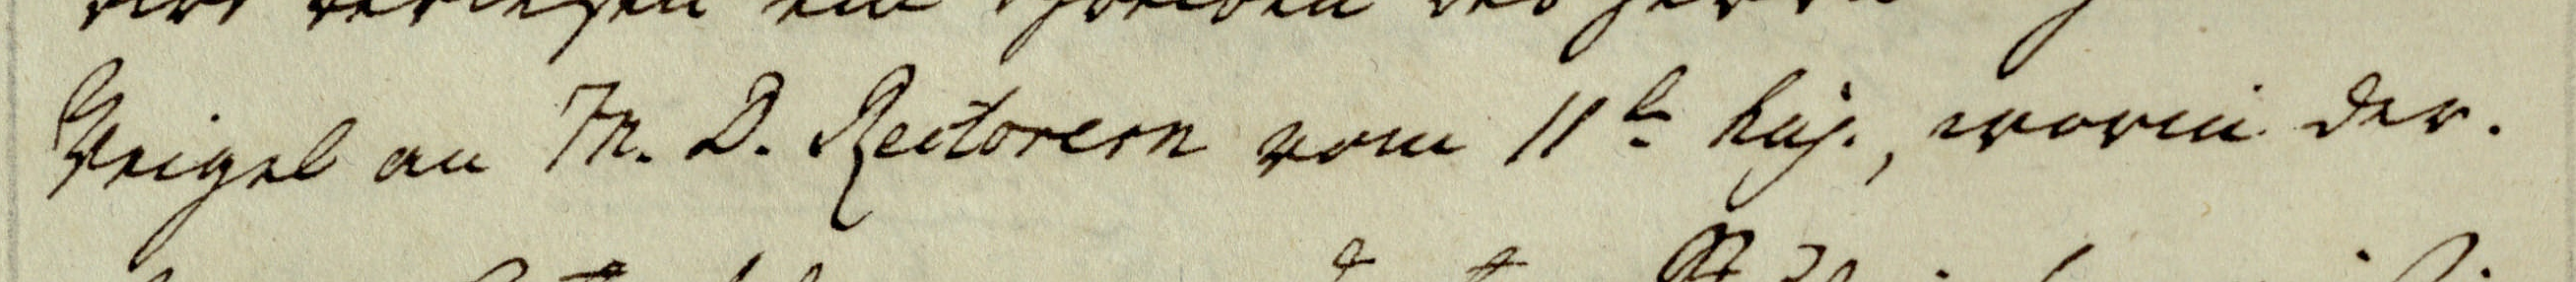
Weigel an M. D. Rectorem vom 11 ten huj., worin der¬
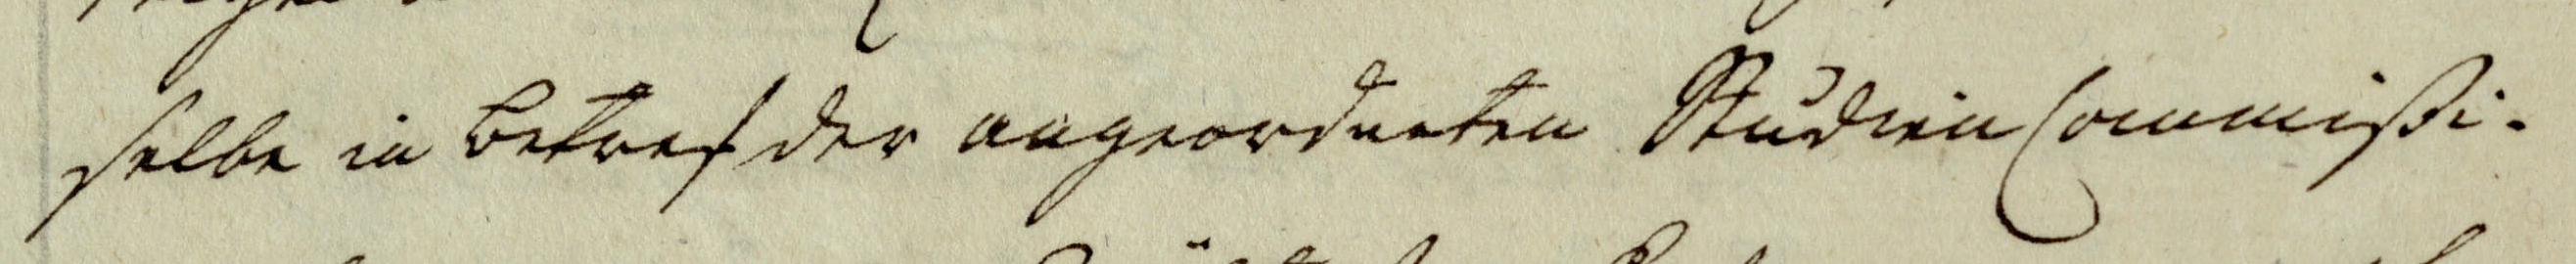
selbe in Betref der angeordneten StudienCommissi¬
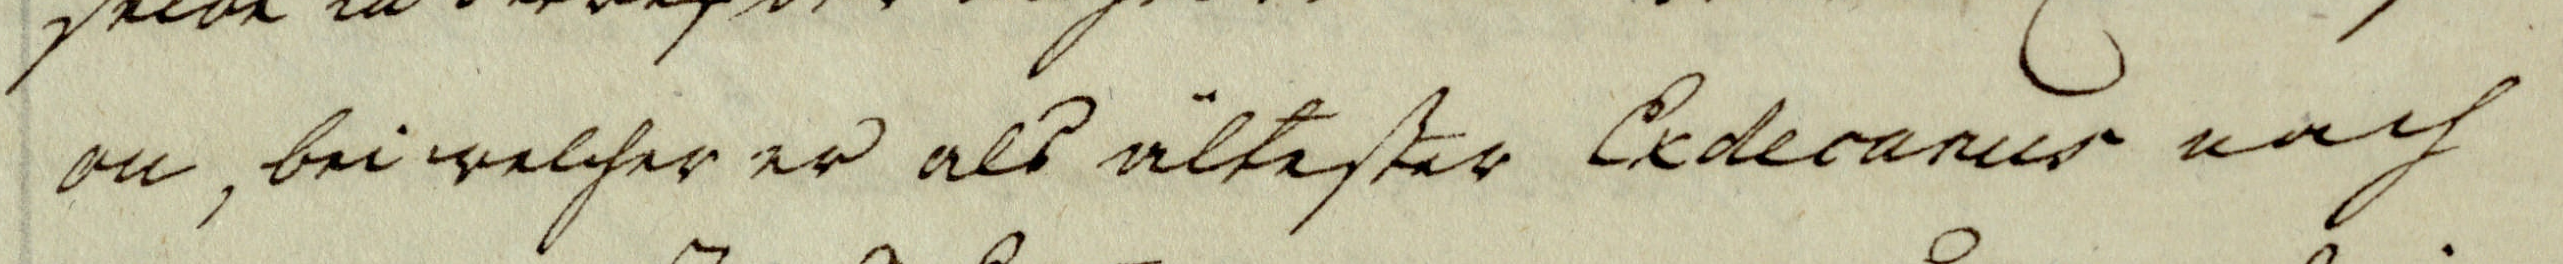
on, bei welcher er als ältester Exdecanus nach
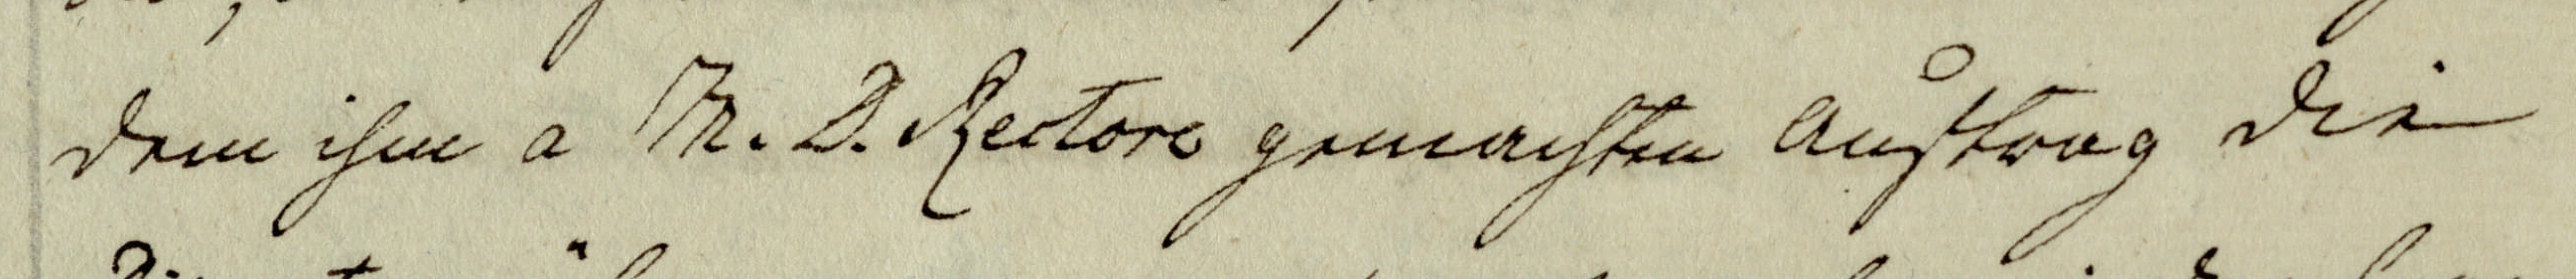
dem ihm a M. D. Rectore gemachten Auftrag die
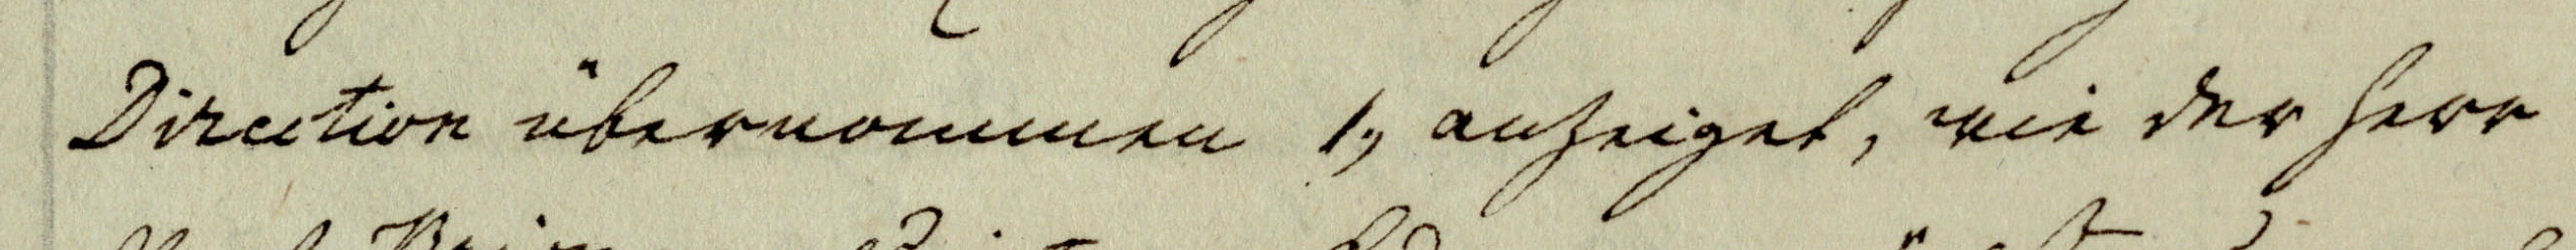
Direction übernommen 1., anzeiget, wie der Herr
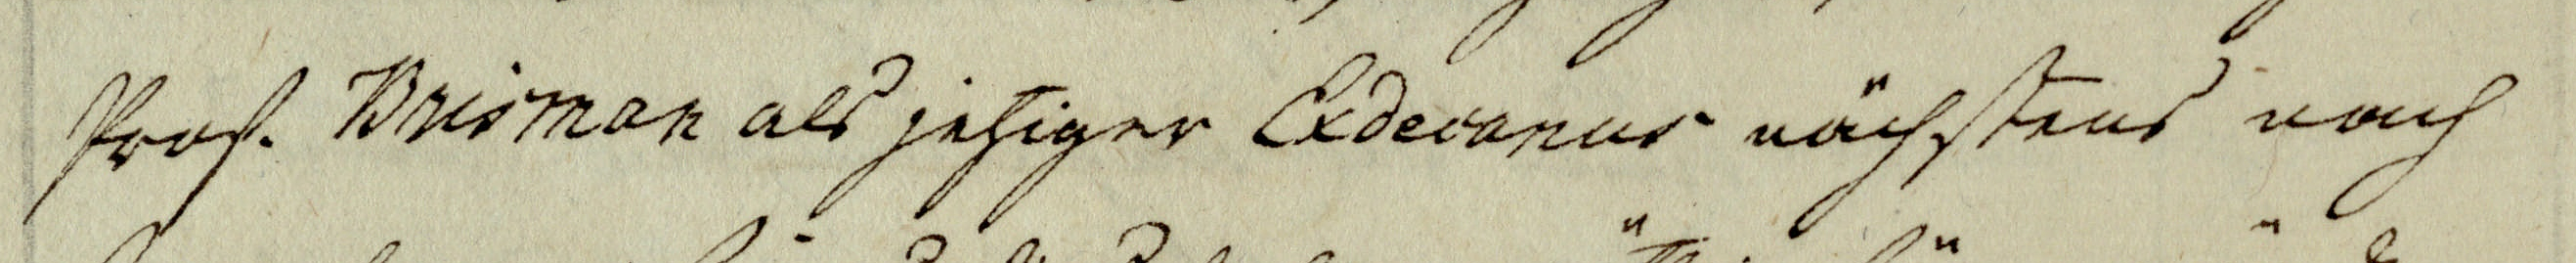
Prof. Brisman als jetziger Exdecanus nächstens nach
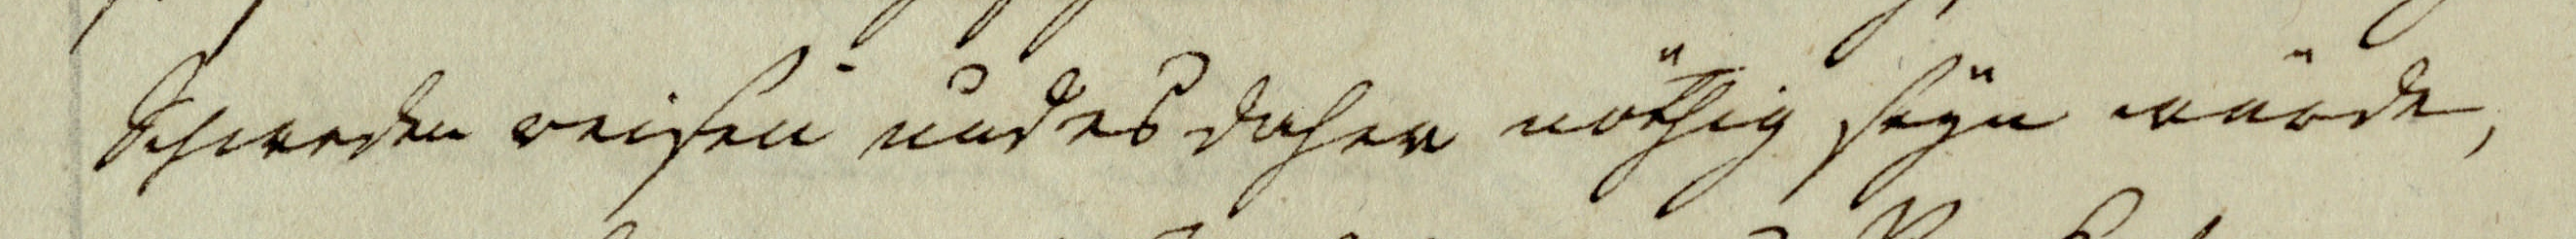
Schweden reisen und es daher nöthig seÿn würde,
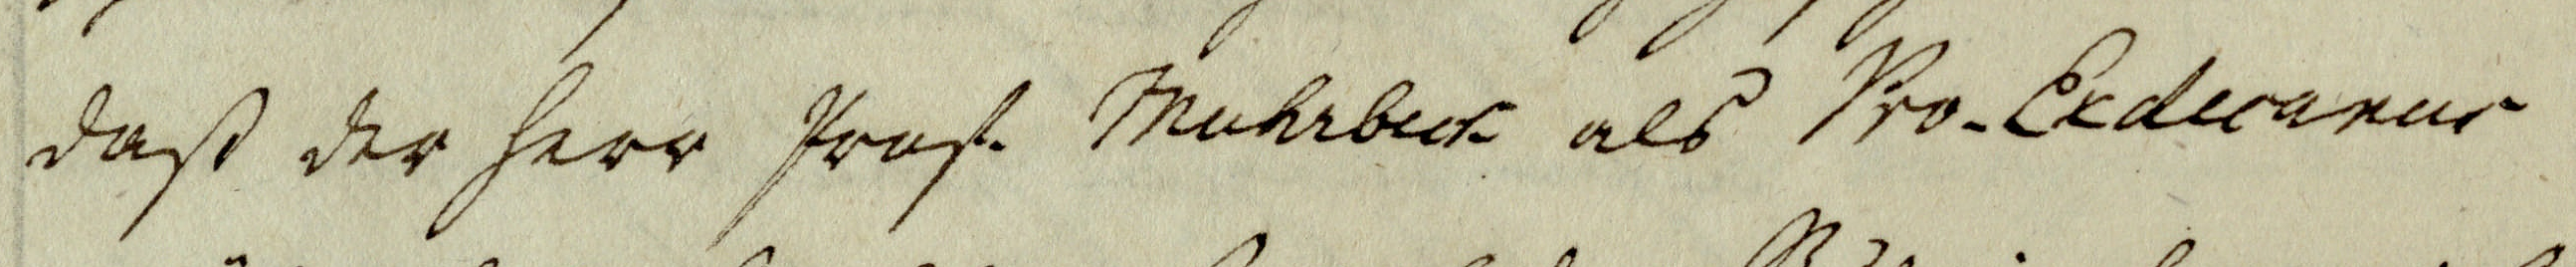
daß der Herr Prof. Muhrbeck als Pro. Exdecanus
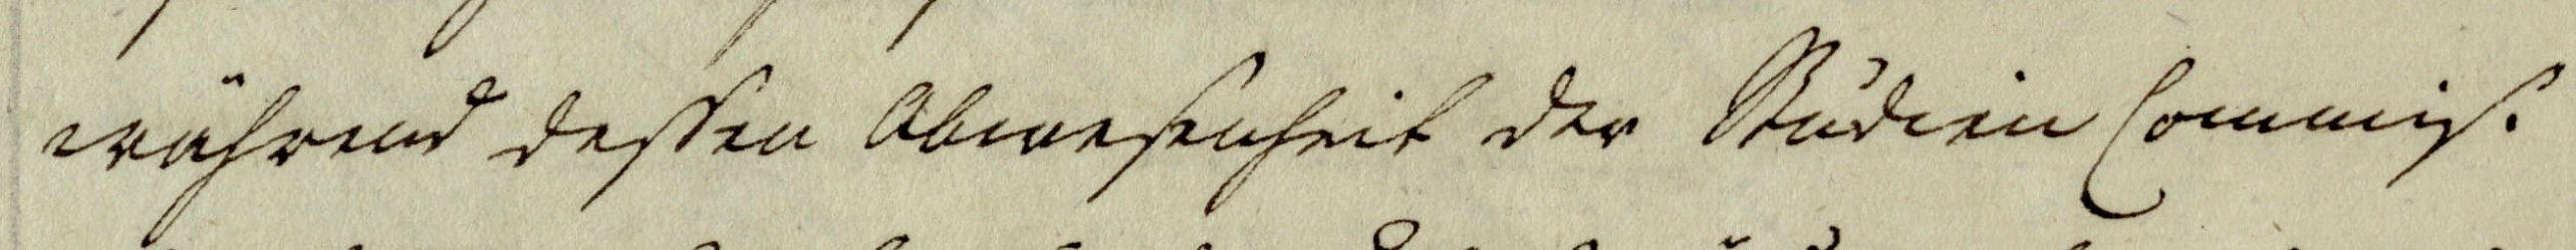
während dessen Abwesenheit der Studien Commis¬
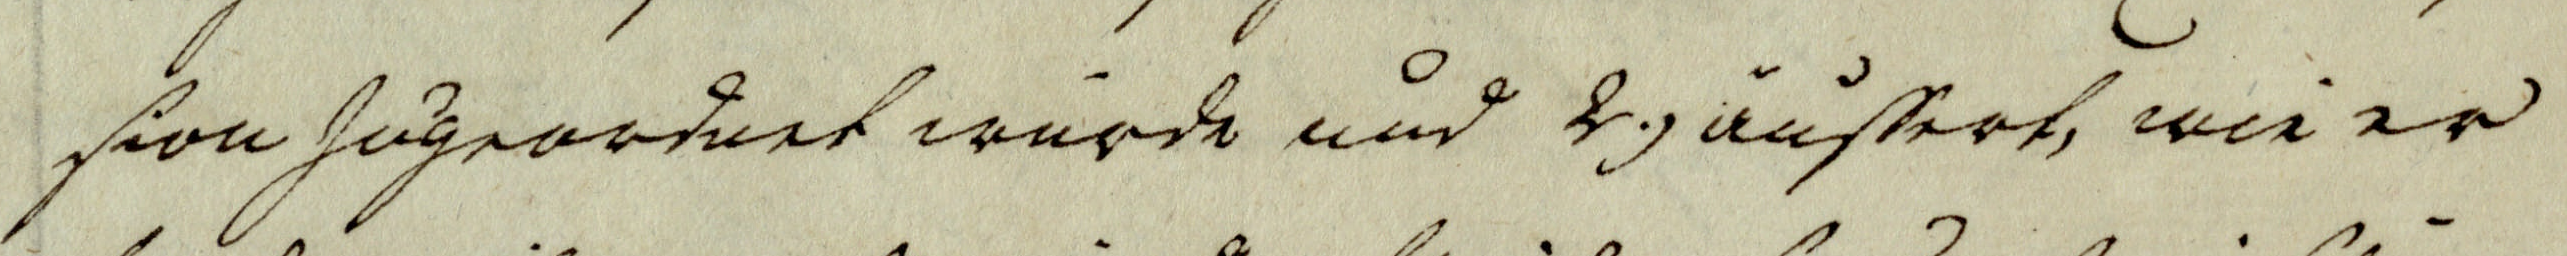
sion zugeordnet würde und 2., äussert, wie er
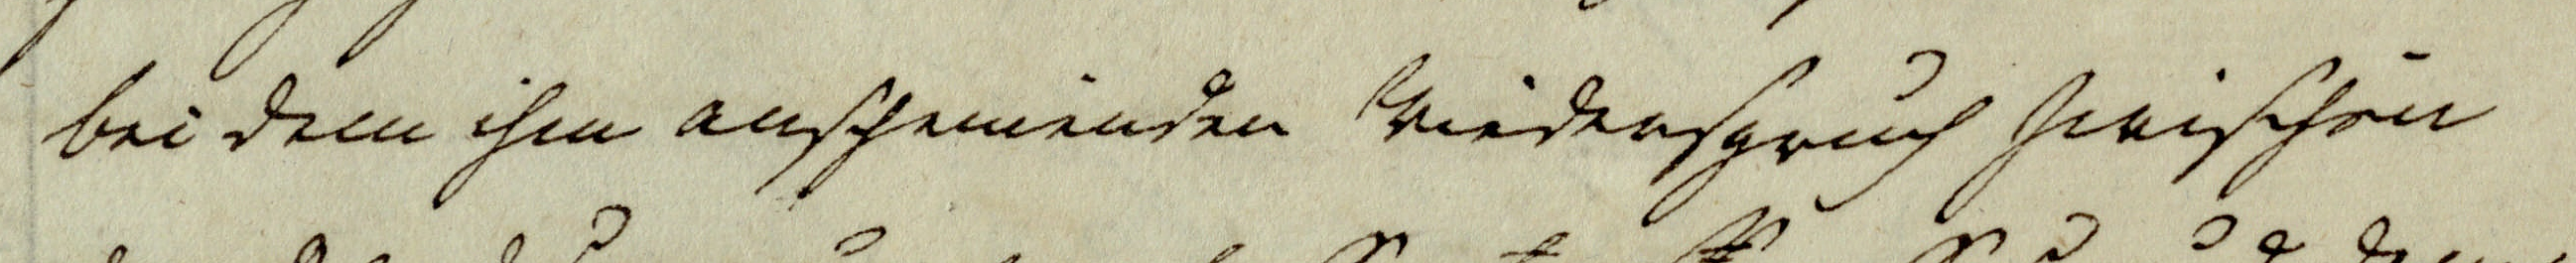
bei dem ihm anscheinenden Wiederspruch zwischen
